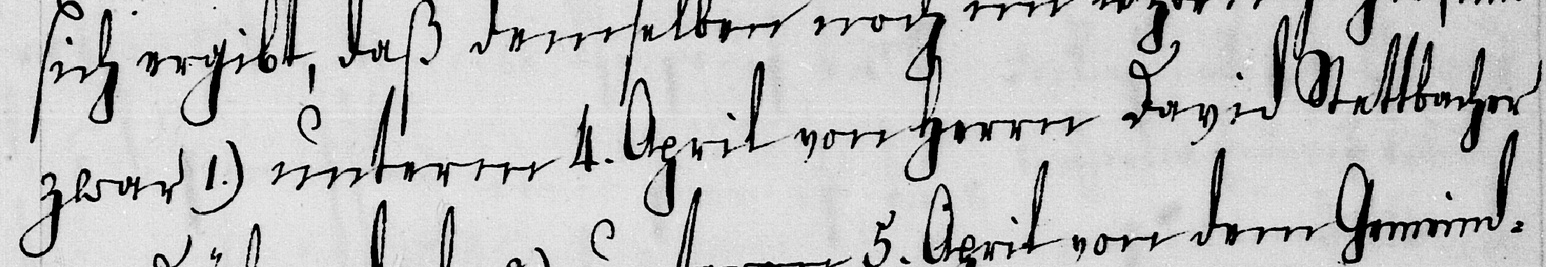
zwar 1.) unterm 4. April von Herrn David Stettbacher
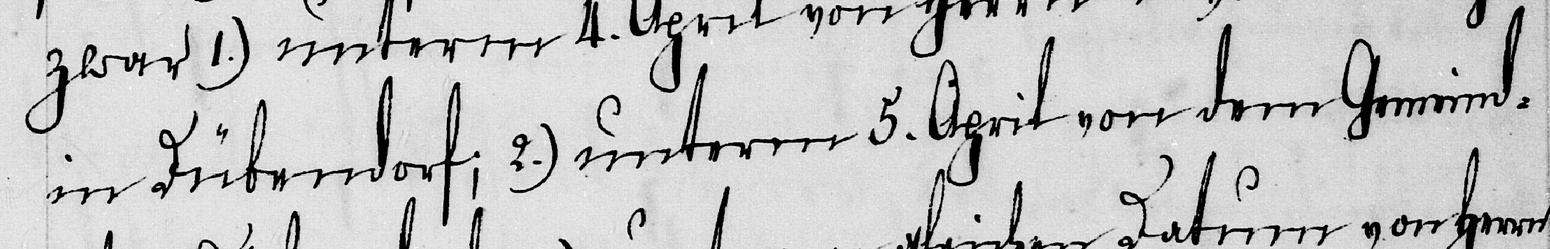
in Dübendorf; 2.) unterm 5. April von dem Gemeind¬
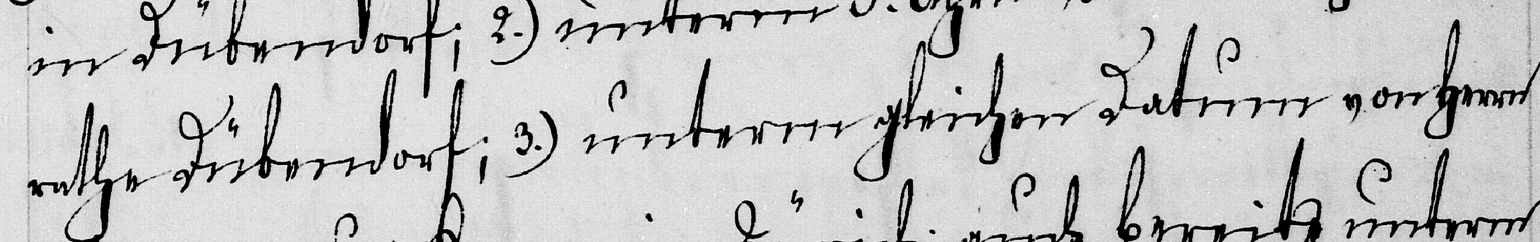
rathe Dübendorf; 3.) unterm gleichen Datum von Her¬
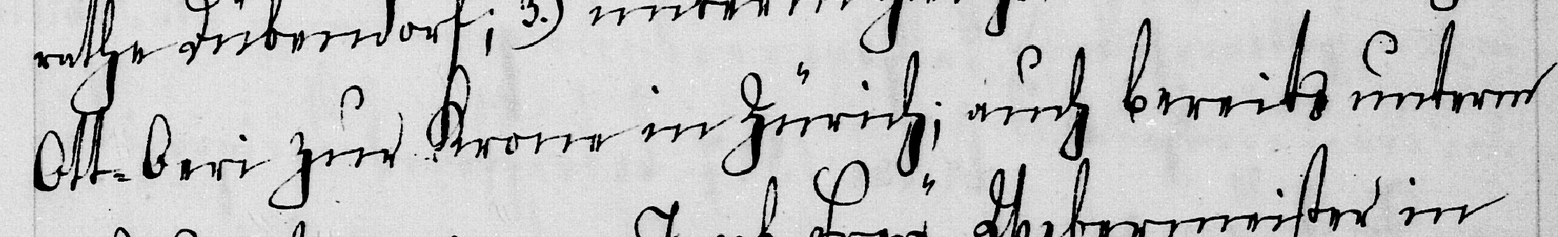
Ott-Oeri zur Krone in Zürich; auch bereits unterm
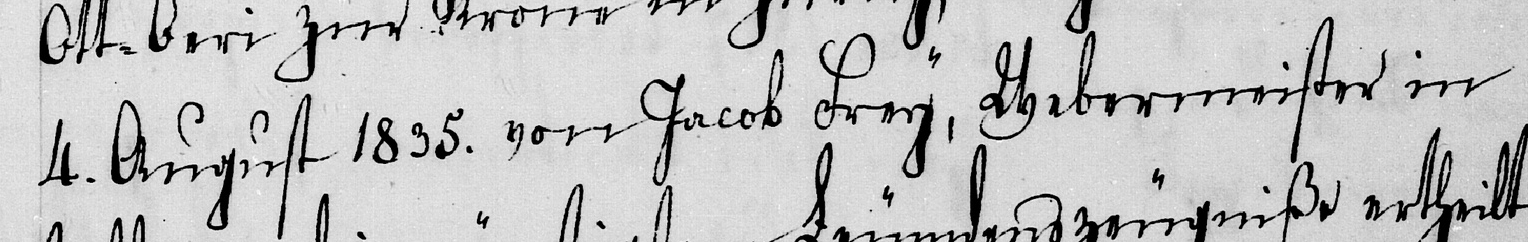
4. August 1835. von Jacob Frey, Webermeister in
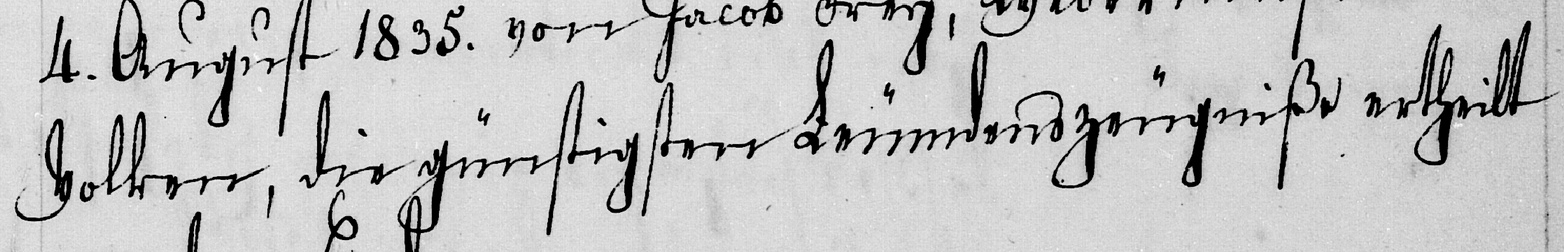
Volken, die günstigsten Leumdenszeugniße ertheilt
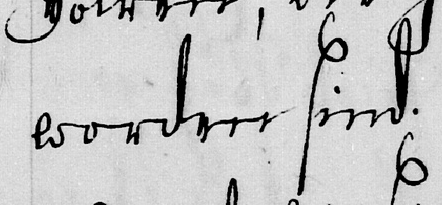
worden sind.
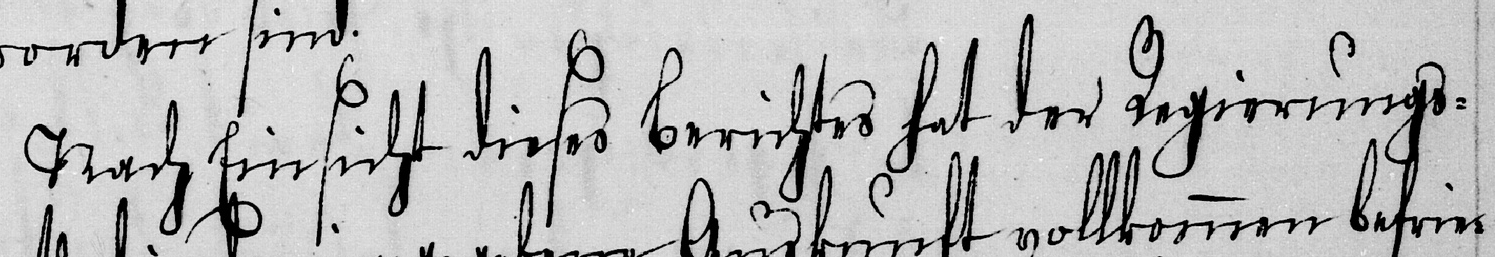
Nach Einsicht dieses Berichts hat der Regierungs¬
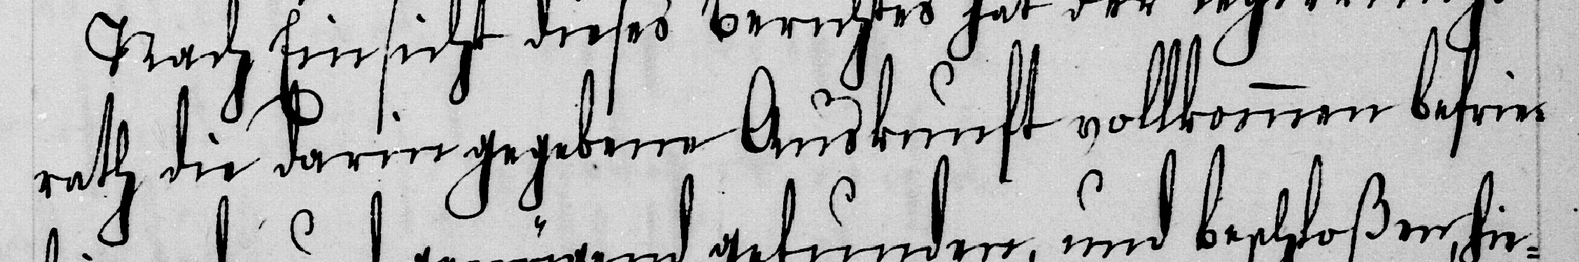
rath die darin gegebene Auskunft vollkommen befrie¬
